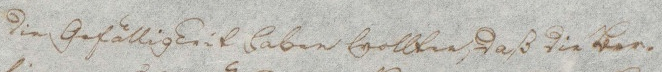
die Gefälligkeit haben wollten, daß die Ber-
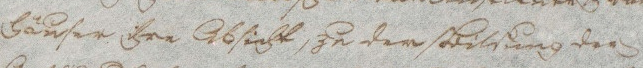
häuser ihre Absicht, zu der Bildung der
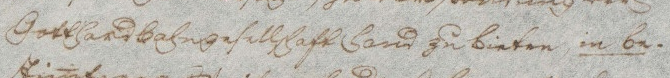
Gotthardbahngesellschaft Hand zu bieten, in be-
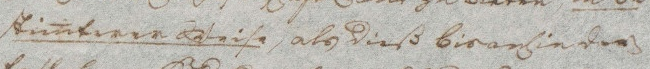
stimmterer Weise, als dieß bisanhin der
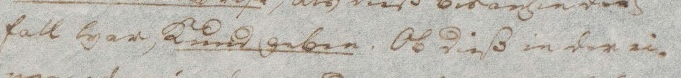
Fall war, Kund geben. Ob dieß in der ei-
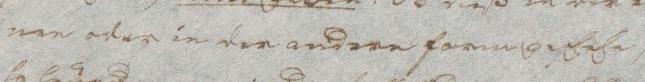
nen oder in der andern Form geschehe,
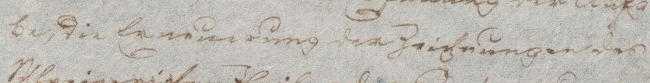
be, die Erneuerung der Zeichnungen des
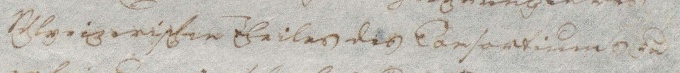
Schweizerischen Theiles des Consortiums zu
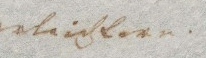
erleichtern.
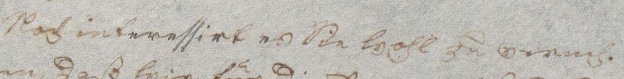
Noch interessirt es Sie wohl zu verneh-
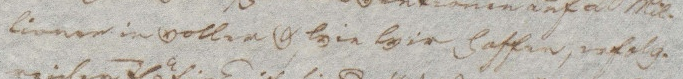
lionen in voller & wie wir hoffen, erfolg-
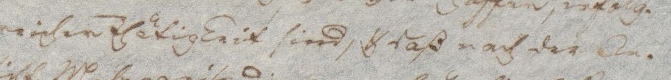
reicher Thätigkeit sind, & daß nach der An-
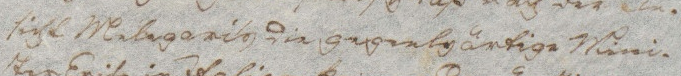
sicht Melegari's die gegenwärtige Mini-
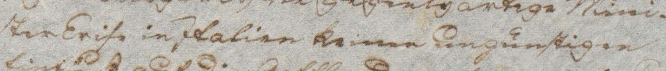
sterkrise in Italien keinen ungünstigen
